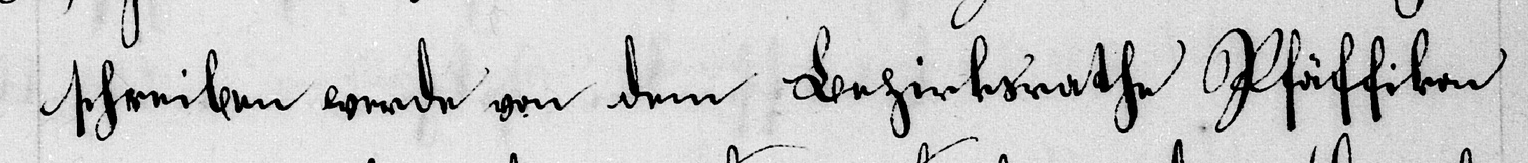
schreiben werde von dem Bezirksrathe Pfäffikon
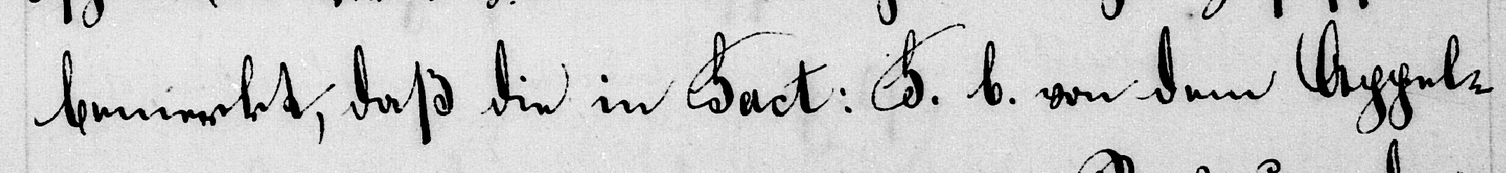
bemerkt, daß die in Fact: F. b. von dem Appel¬
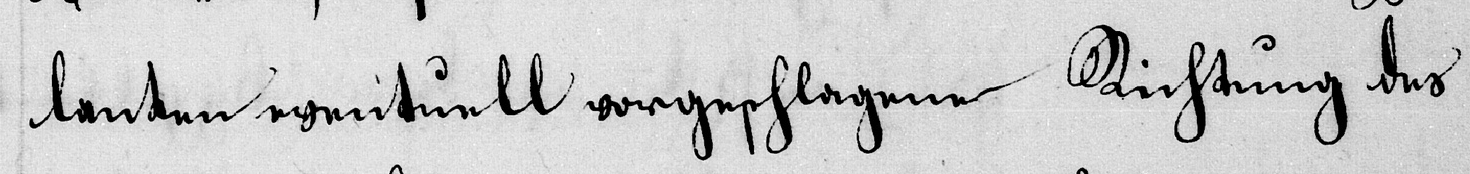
lanten eventuell vorgeschlagene Richtung des
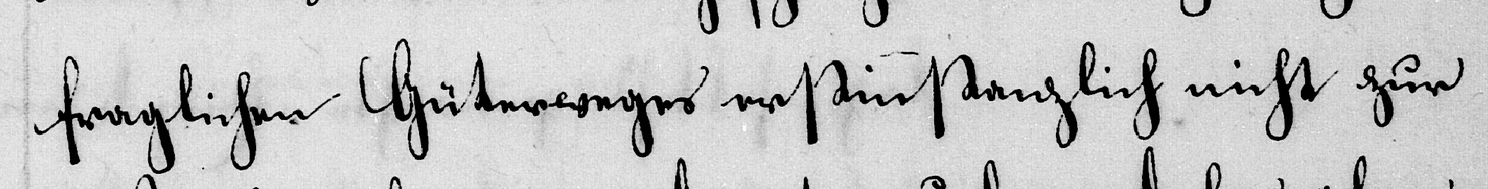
fraglichen Güterweges erstinstanzlich nicht zur
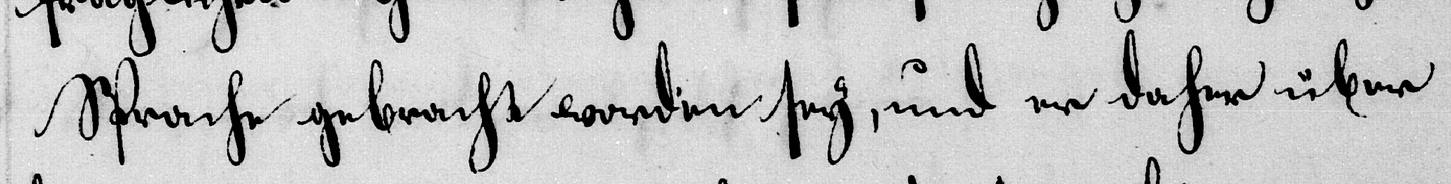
Sprache gebracht worden sey, und er daher über
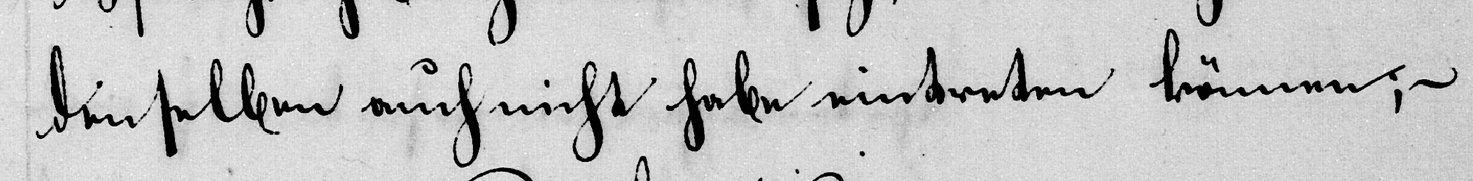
denselben auch nicht habe eintreten können; –
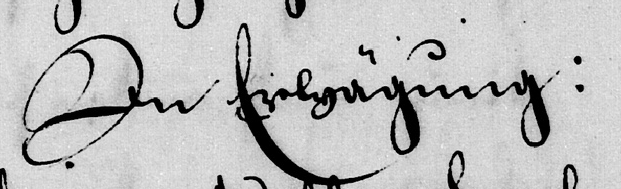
In Erwägung:
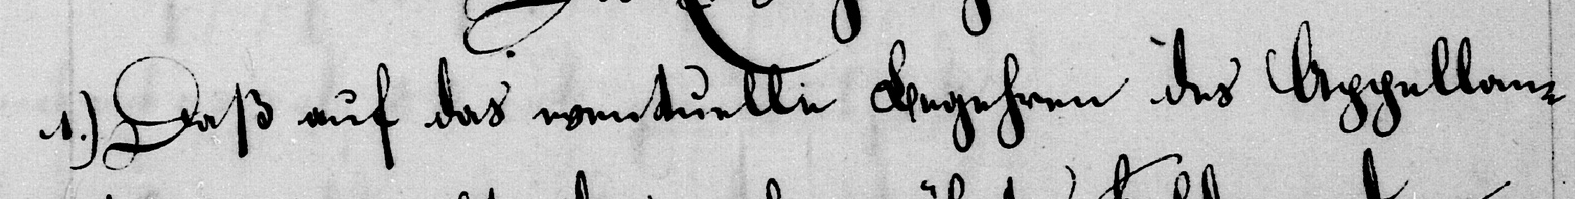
1.) Daß auf das eventuelle Begehren des Appellan¬
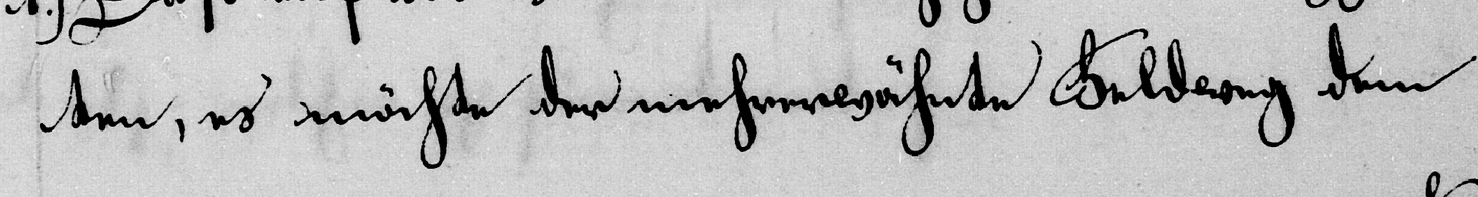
ten, es möchte der mehrerwähnte Feldweg dem
